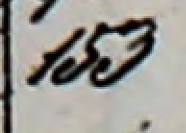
153
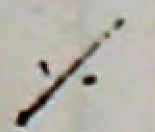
./.
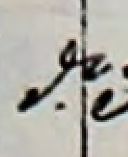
Do
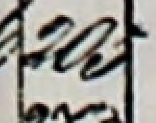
205
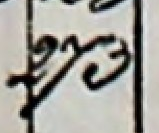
273
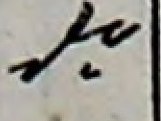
Do
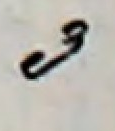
3
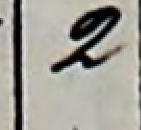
2
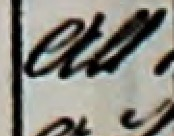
Alt
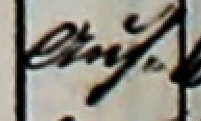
Aus„
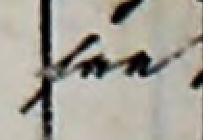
see
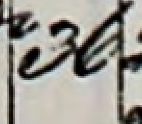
36
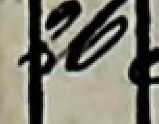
26
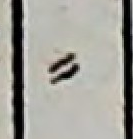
„
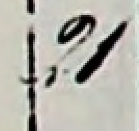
21
